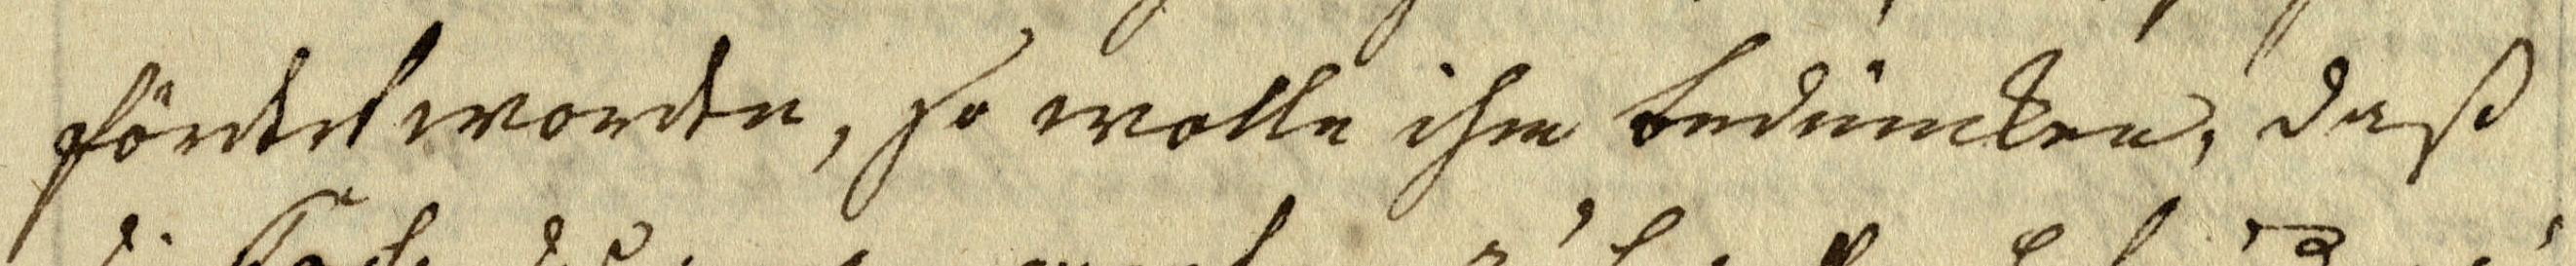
fördert worden, so wolle ihm bedüncken, daß
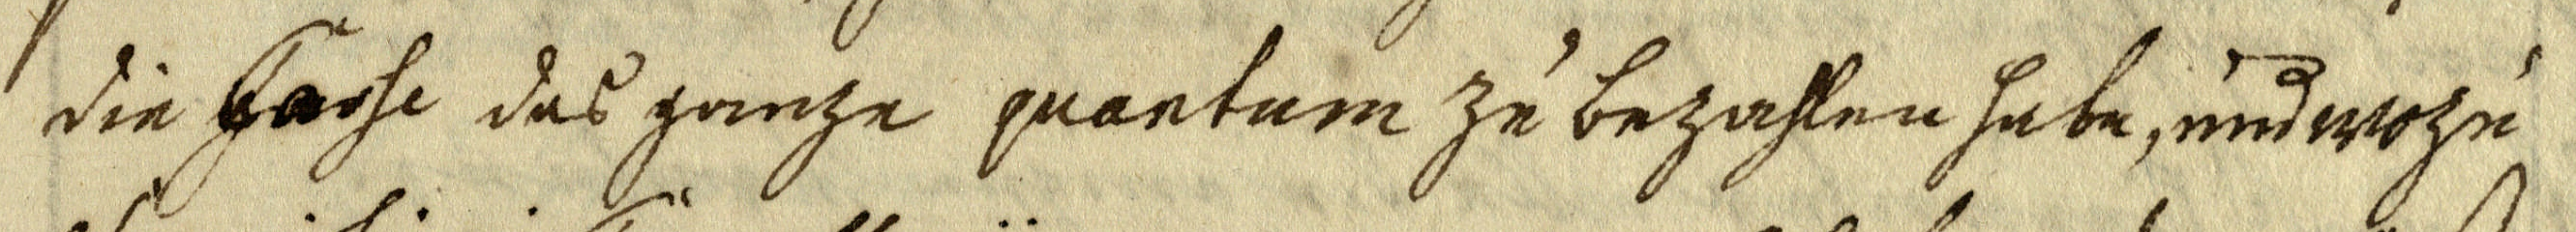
die Casse das ganze quantum zu bezahlen habe, und wozu
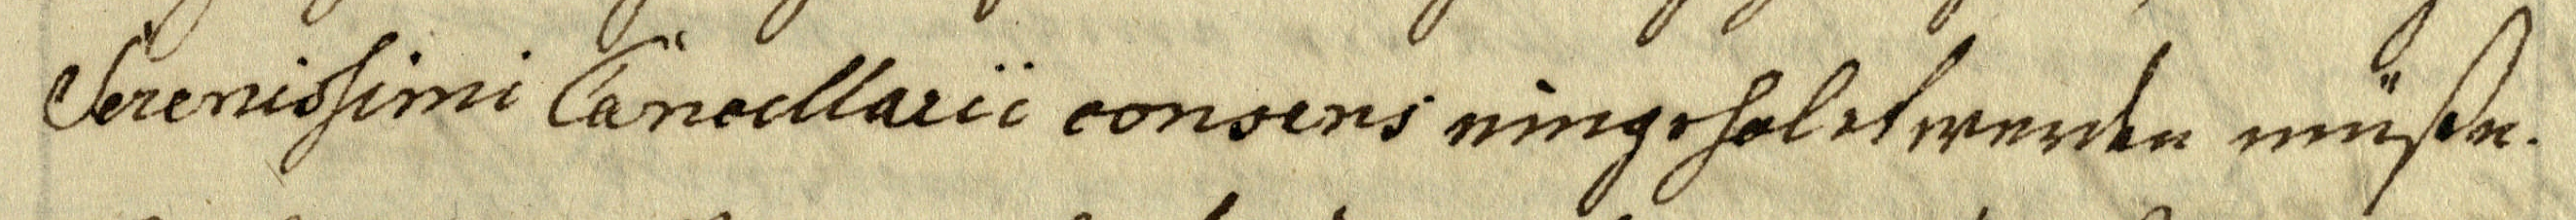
Serenissimi Cancellarii consens eingeholt werden müße.
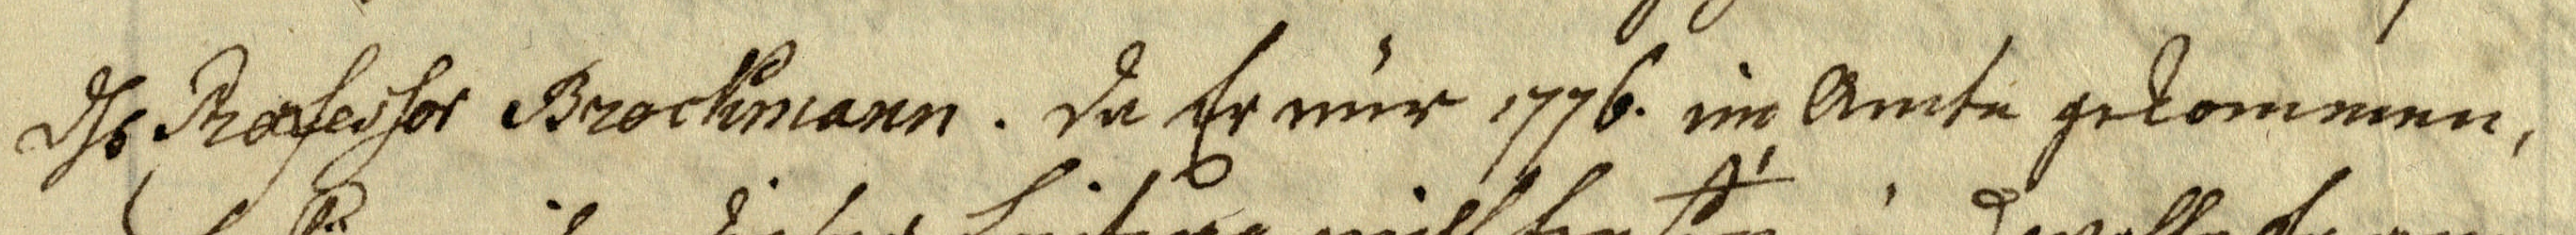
dh Professor Brockmann. da Er nur 1776. im Amte gekommen,
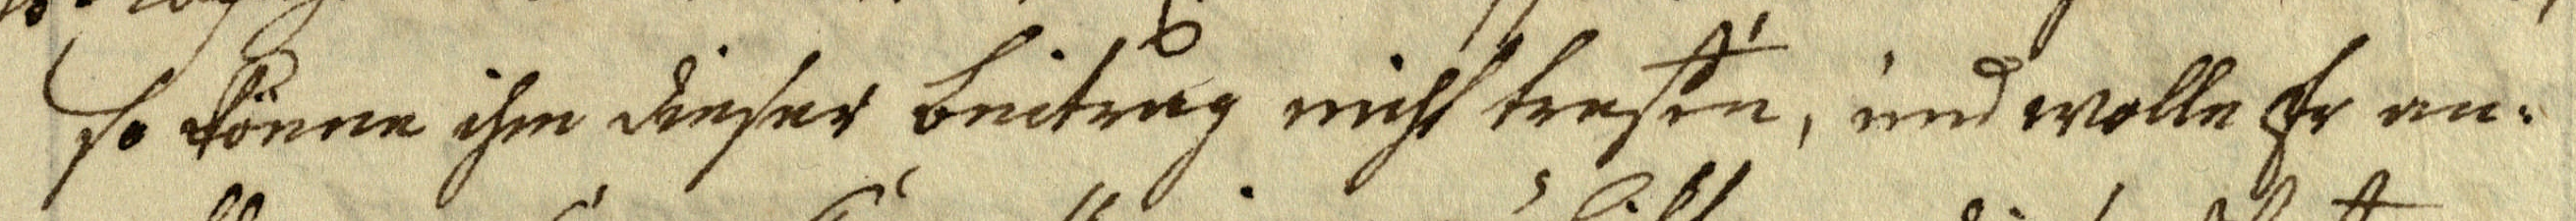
so könne ihn dieser Beitrag nicht treffen, und wolle Er an¬
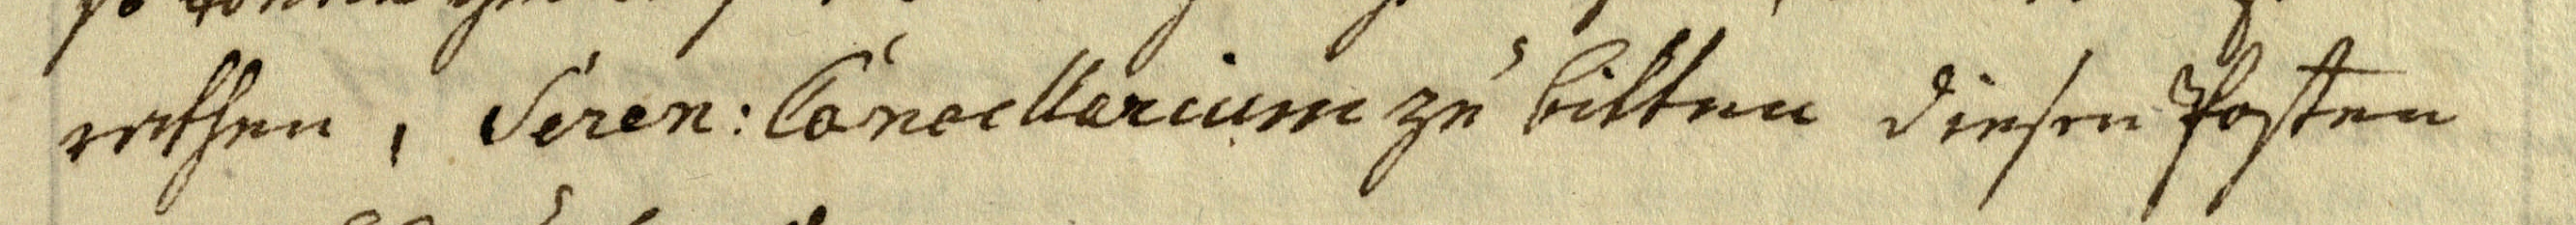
rathen, Seren: Cancellarium zu bitten diesen Posten
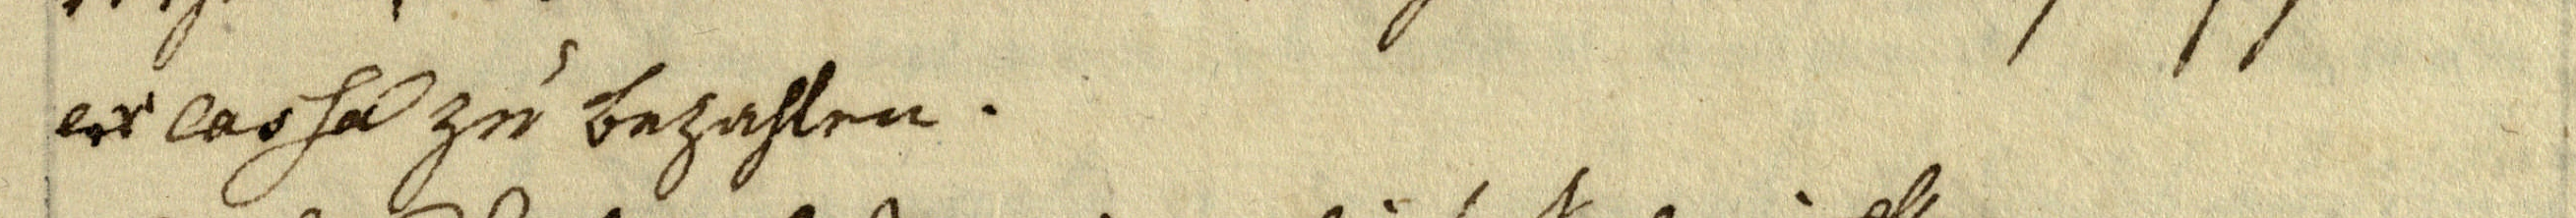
ex cassa zu bezahlen.
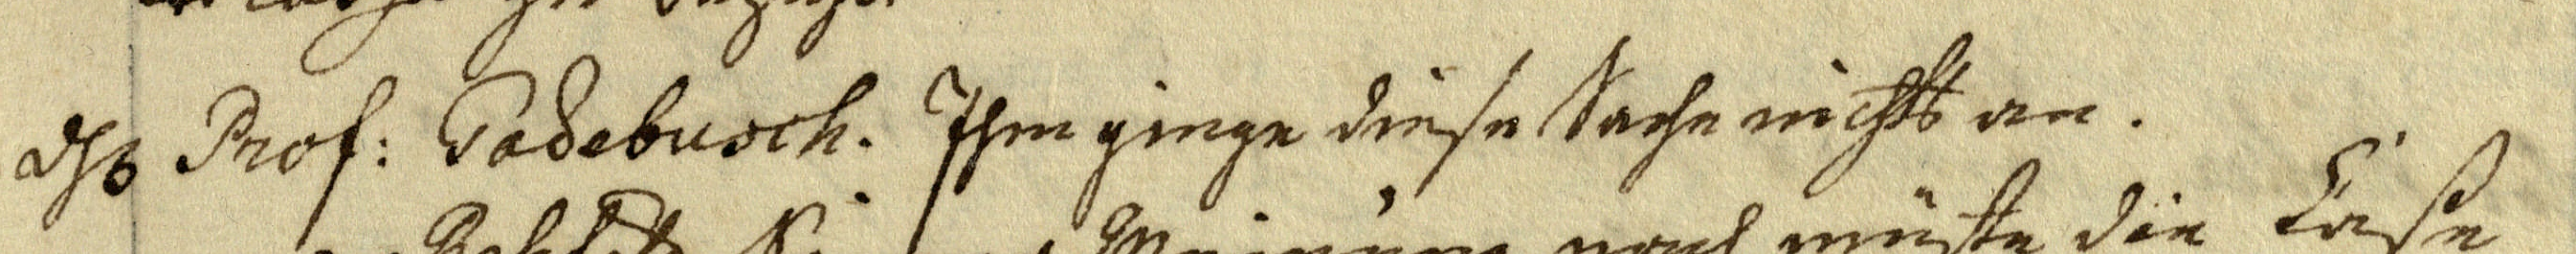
dh Prof: Gadebusch. Ihm ginge diese Sache nichts an.
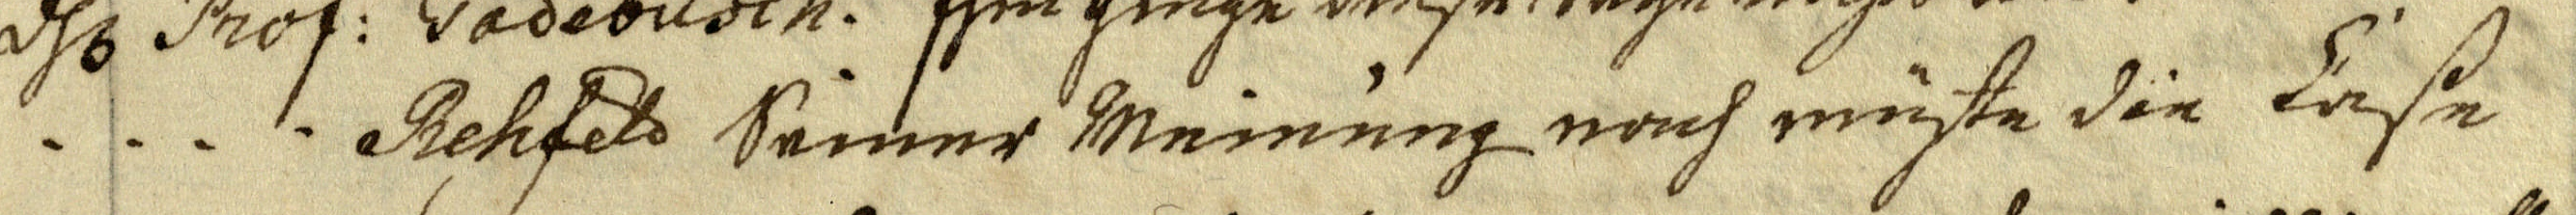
Rehfeld Seiner Meinung nach müste die Caße
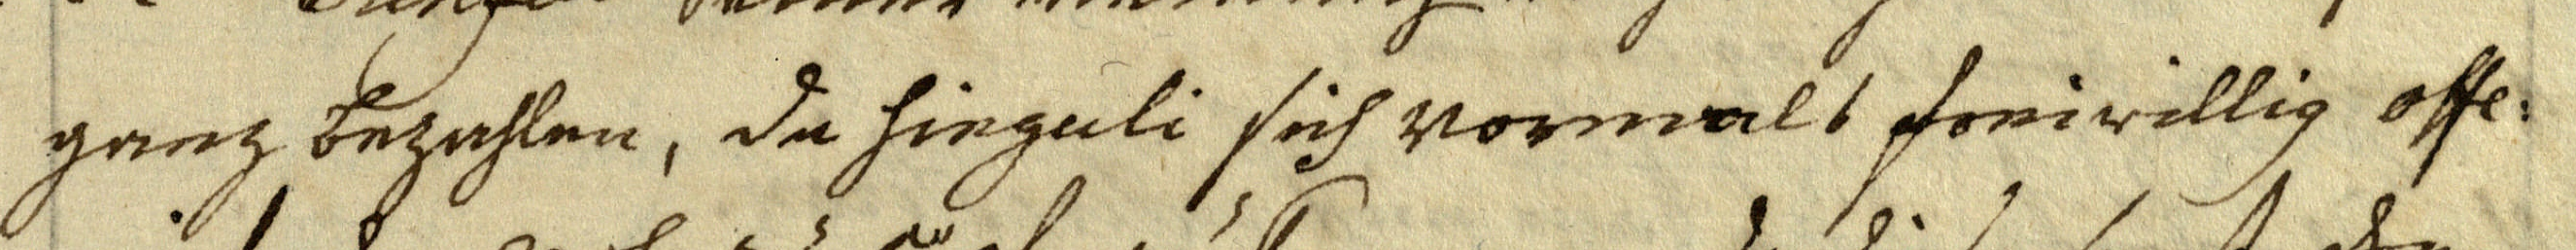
ganz bezahlen, da singuli sich vormals freiwillig offe¬
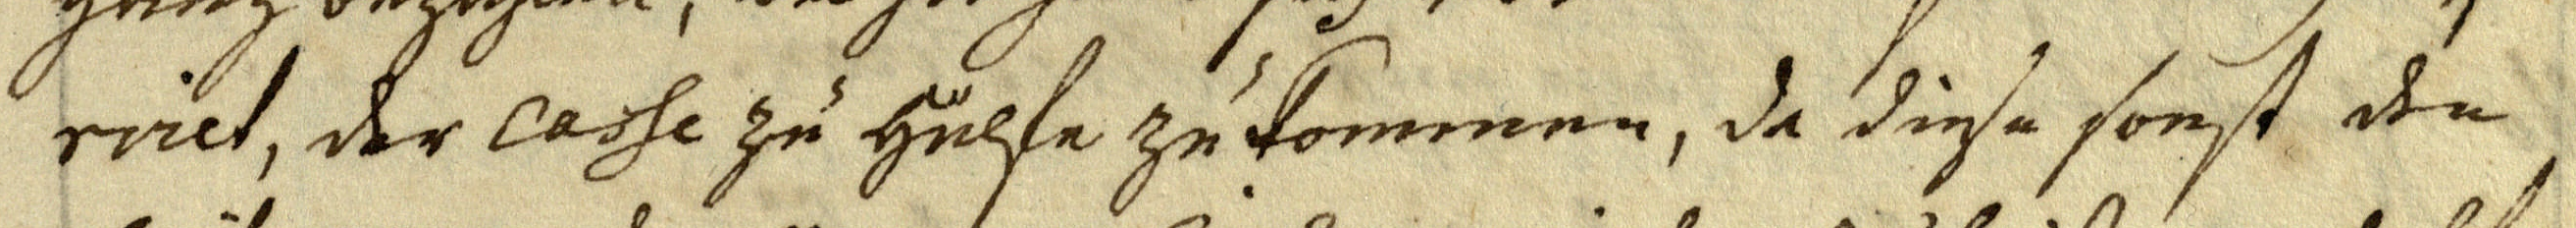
riret, der casse zu Hülfe zu kommen, da diese sonst den
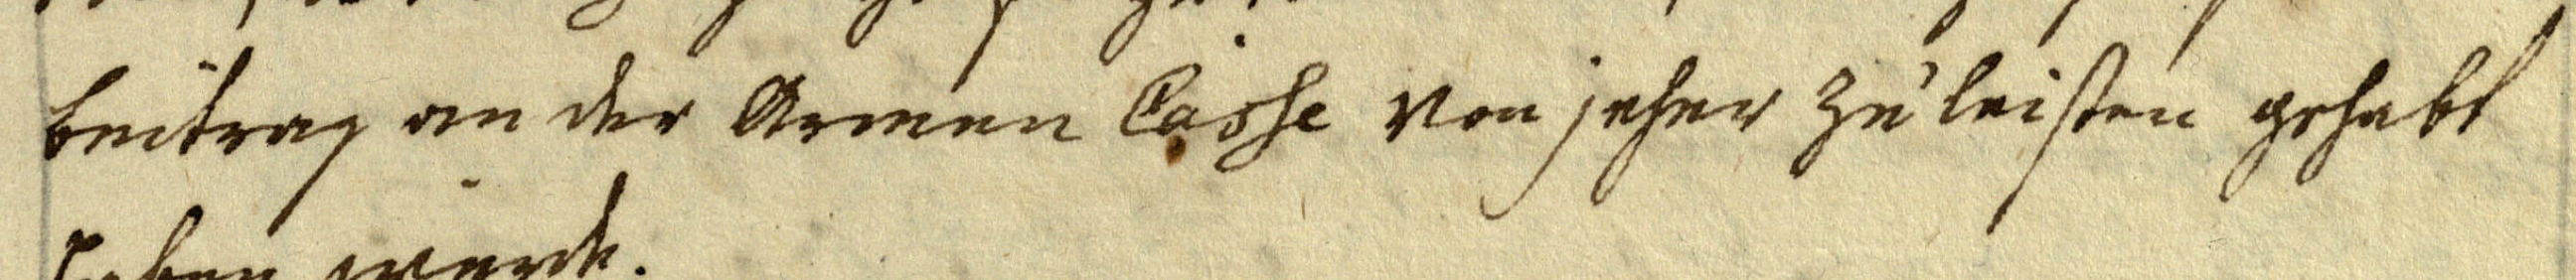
Beitrag an der Armen Casse von jeher zu leisten gehabt
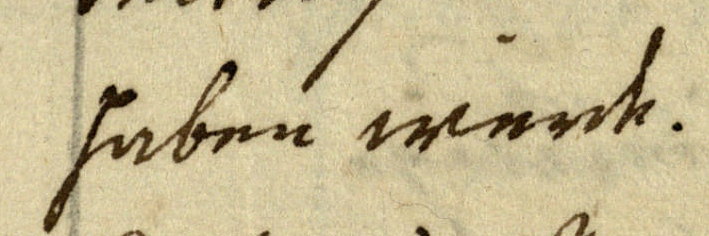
haben würde.
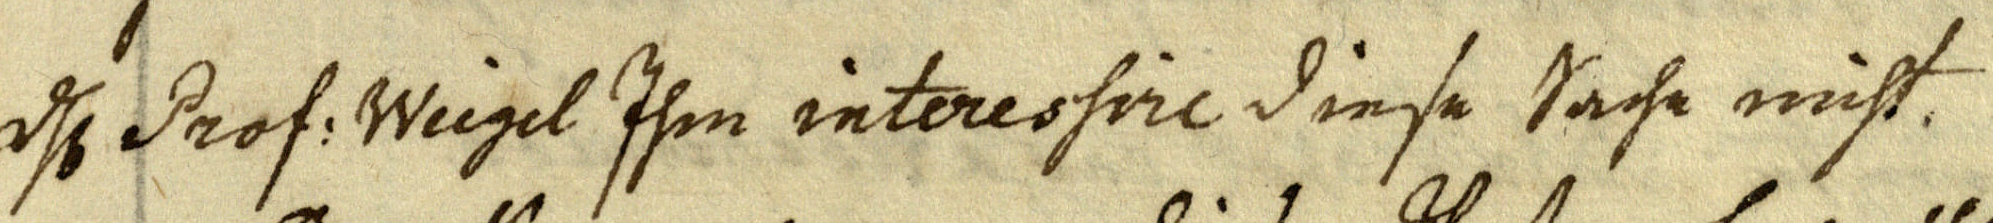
dh Prof: Weigel Ihm interessire diese Sache nicht.
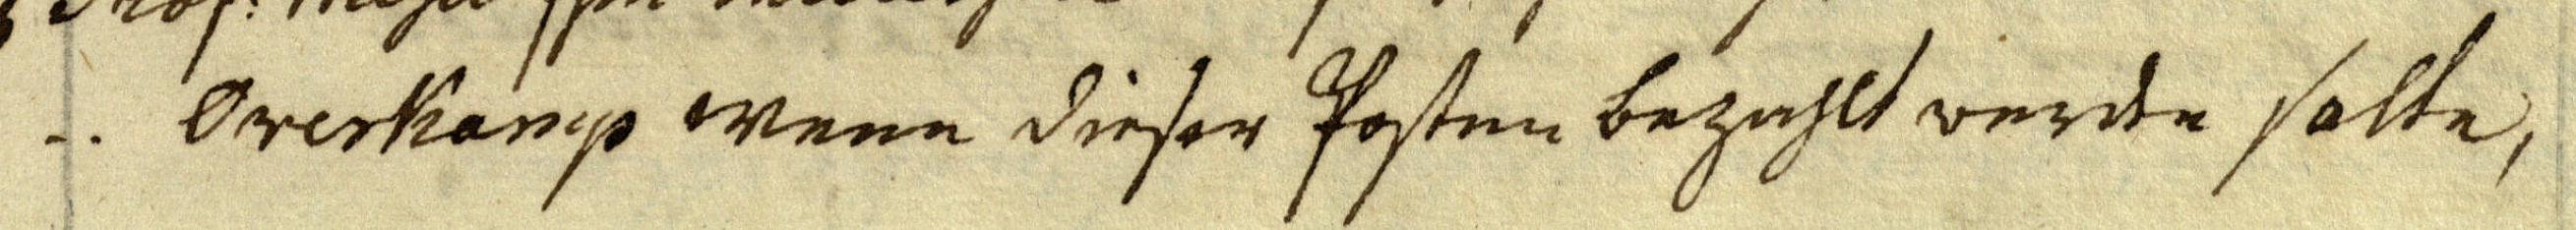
Overkamp wenn dieser Posten bezahlt werden solte,
